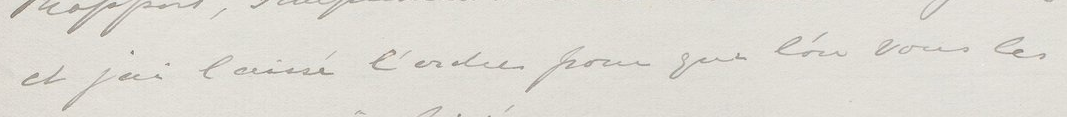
et j'ai laissé l'ordre pour que l'on vous les
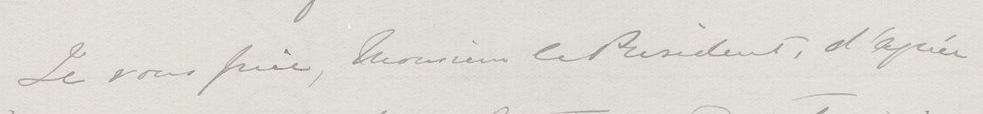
Je vous prie, Monsieur le President, d'agréer
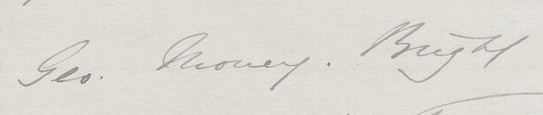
Geo. Money. Bright
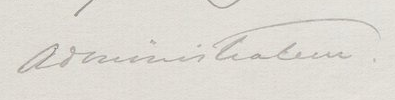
Administrateur
